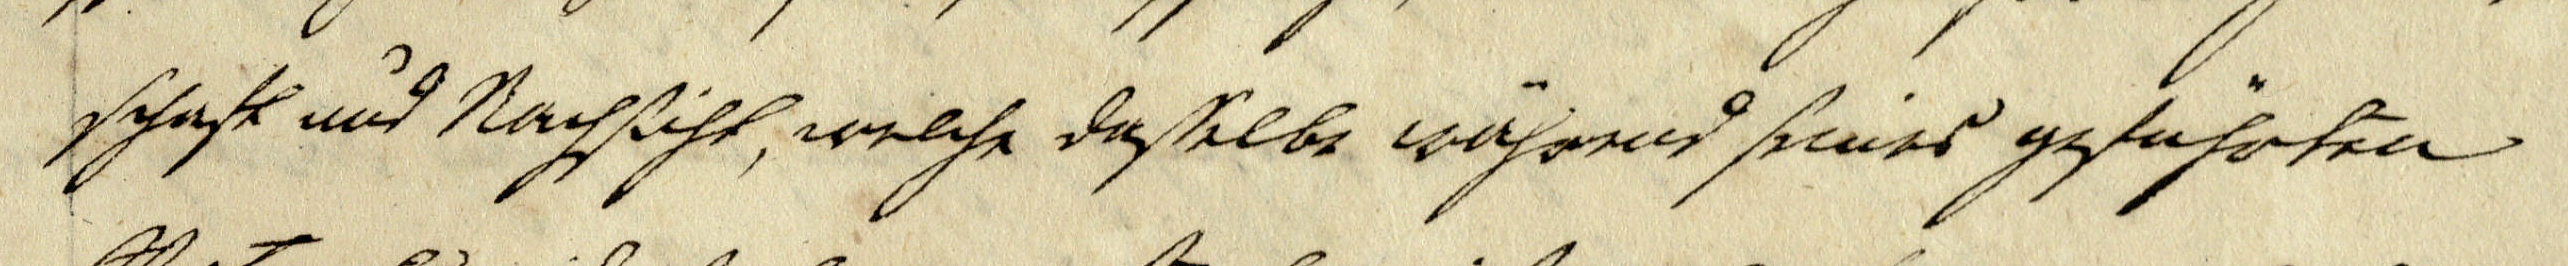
schaft und Nachsicht, welche dasselbe während seines geführten
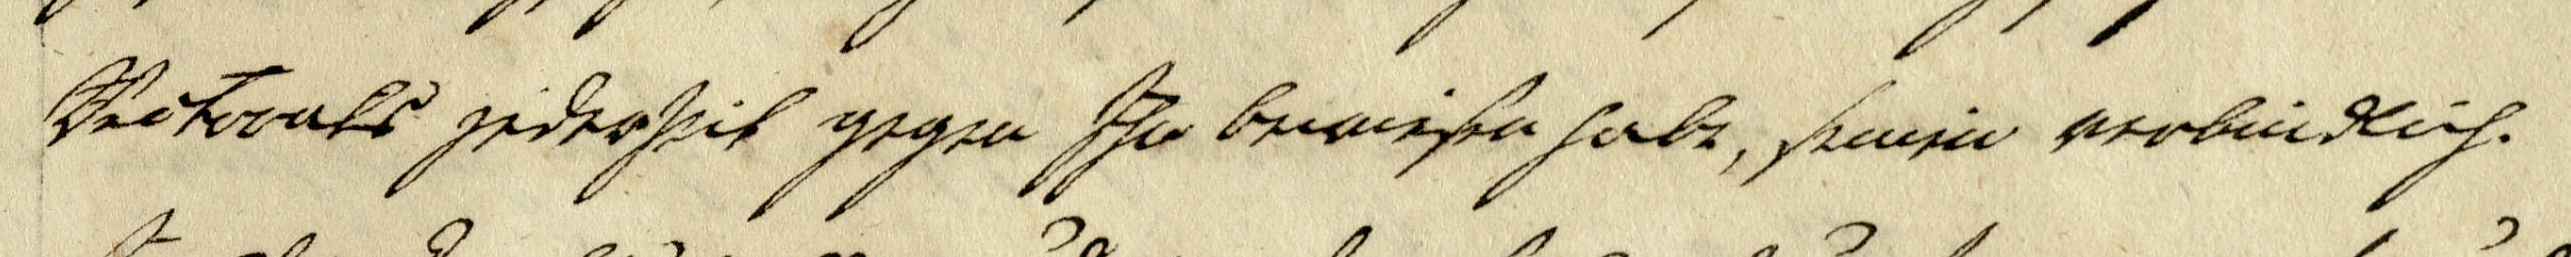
Rectorats jederzeit gegen Ihn bewiesen habe, seinen verbindlich¬
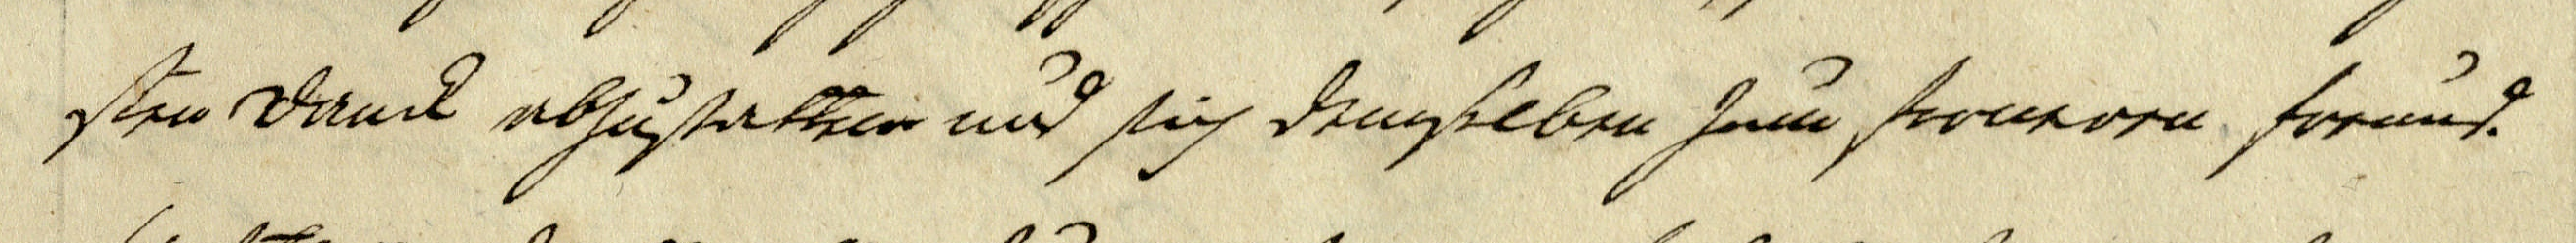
sten Danck abzustatten und sich demselben zum ferneren freund¬
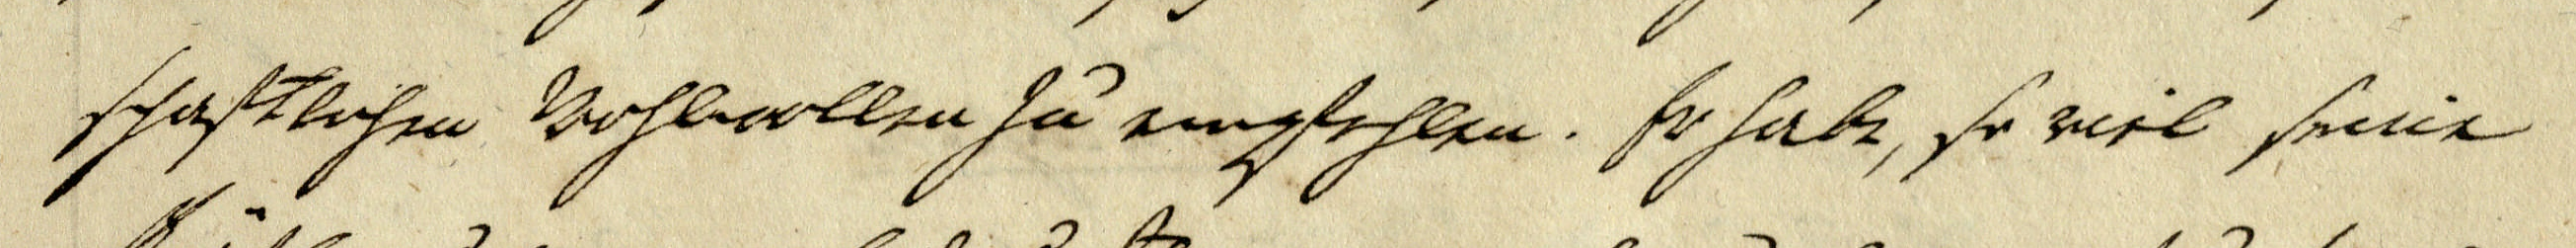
schaftlichen Wohlwollen zu empfehlen. Er habe, so viel seine
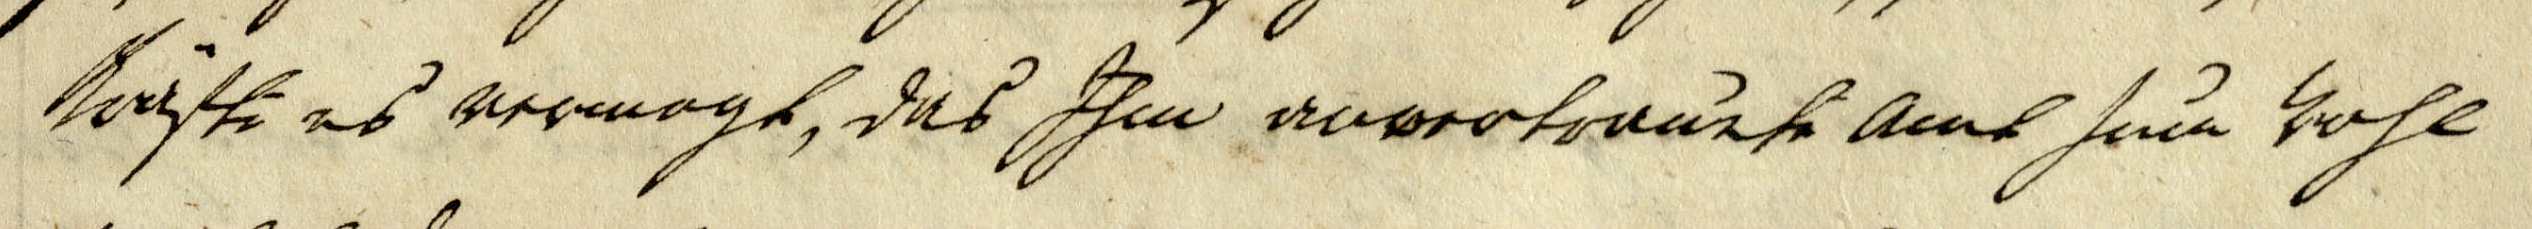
Kräfte es vermogt, das Ihm anvertrauet Amt zum Wohl
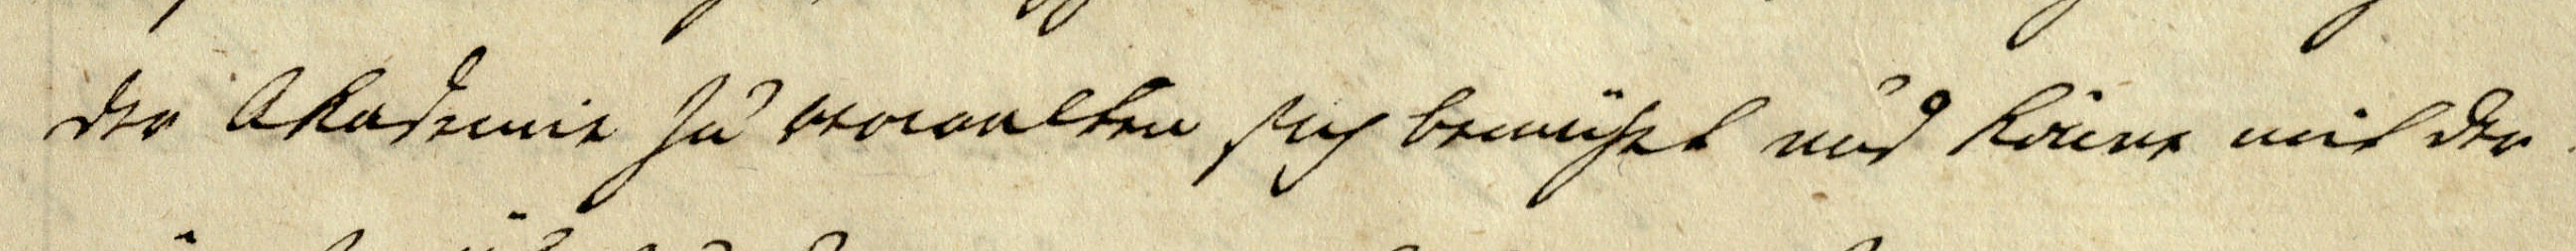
der Akademie zu verwalten sich bemühet und könne mit der
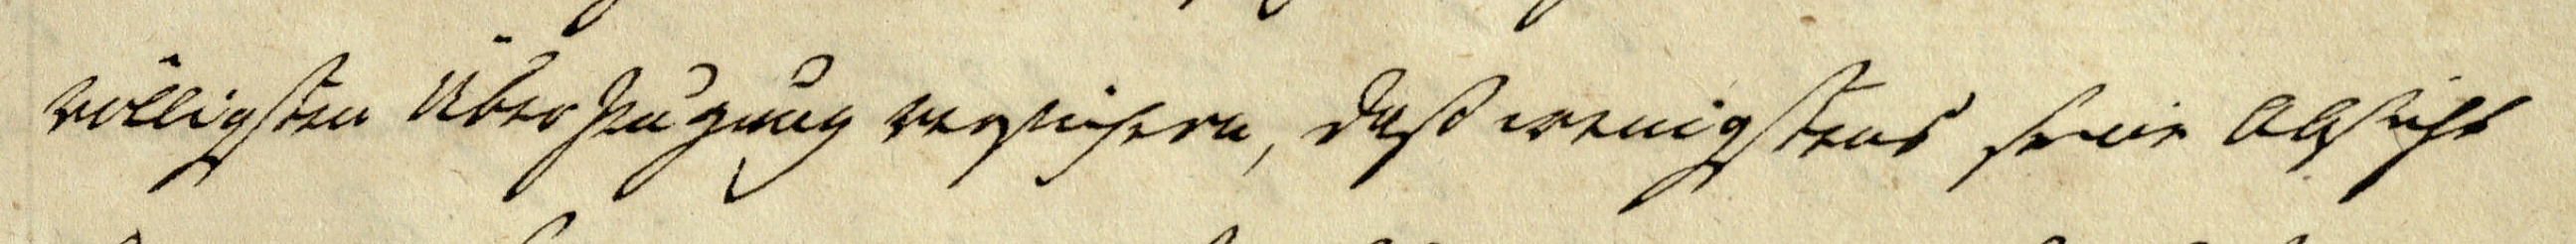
völligsten Überzeugung versichern, daß wenigstens seine Absicht
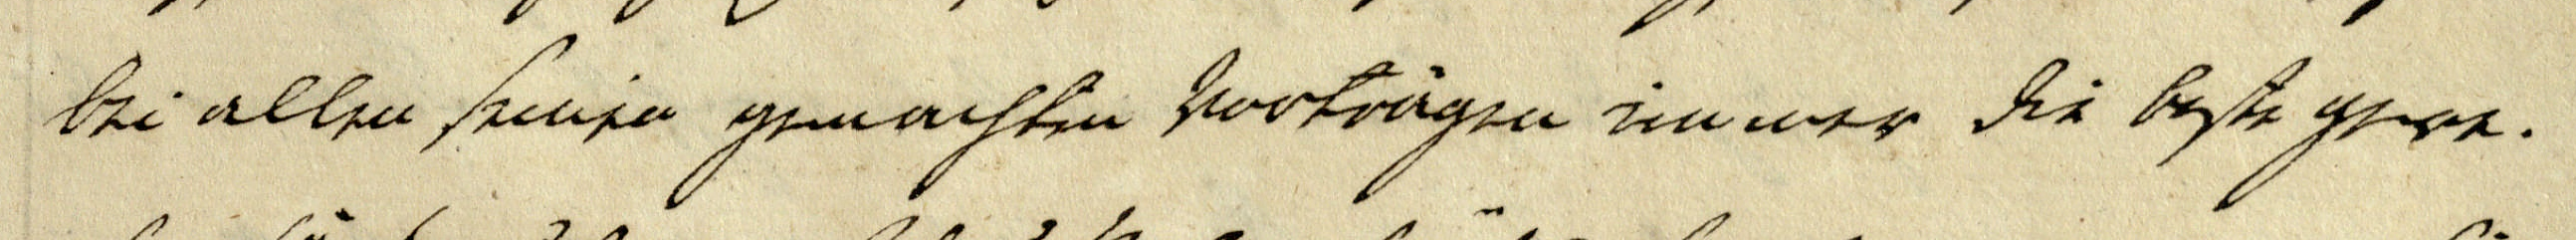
bei allen seinen gemachten Vorträgen immer die beste gewe¬
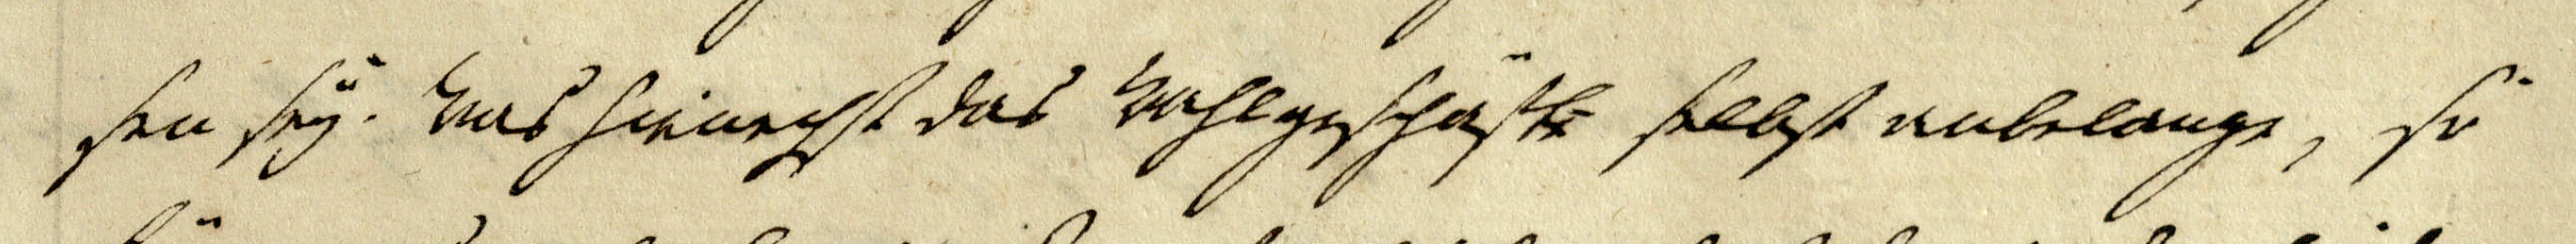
sein seÿ. Was hienechst das Wahlgeschäfte selbst anbelange, so
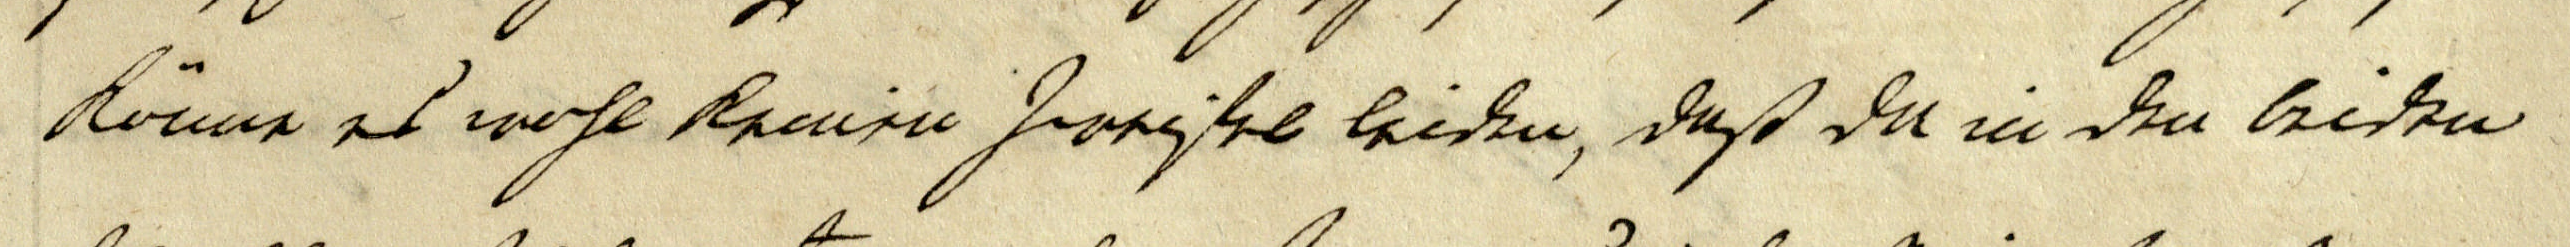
könne es wohl keinen Zweifel leiden, daß da in den beiden
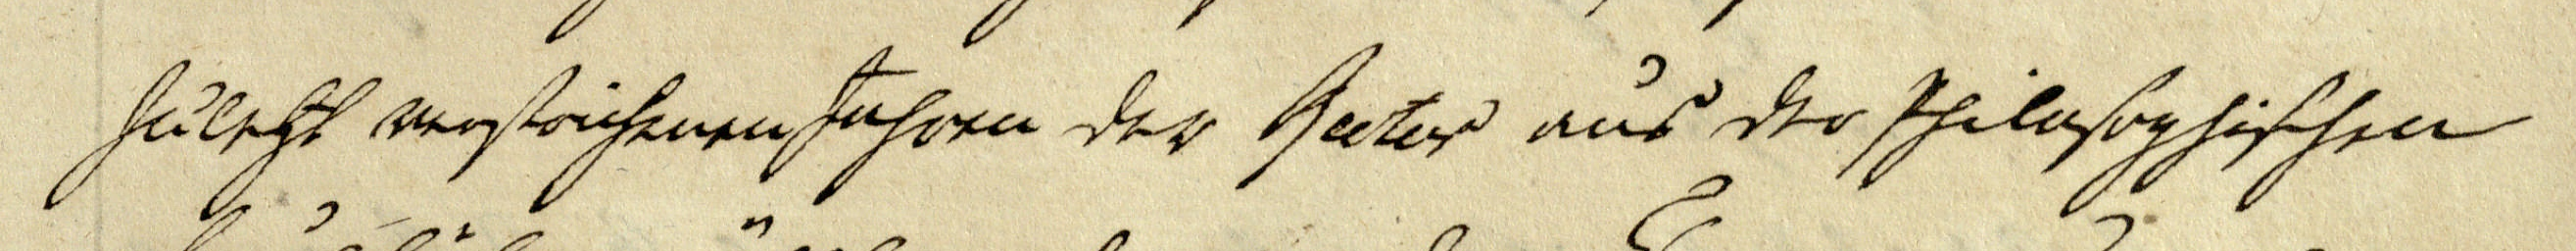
zuletzt verstrichenen Jahren der Rector aus der Philosophischen
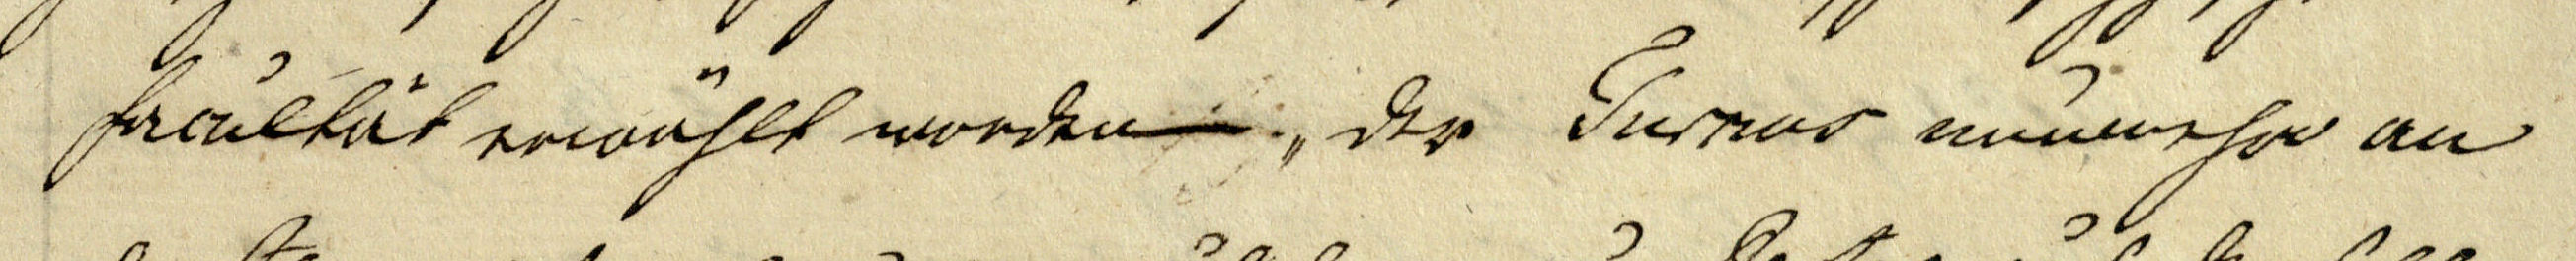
Facultät erwählt worden., der Turnus nunmehro an
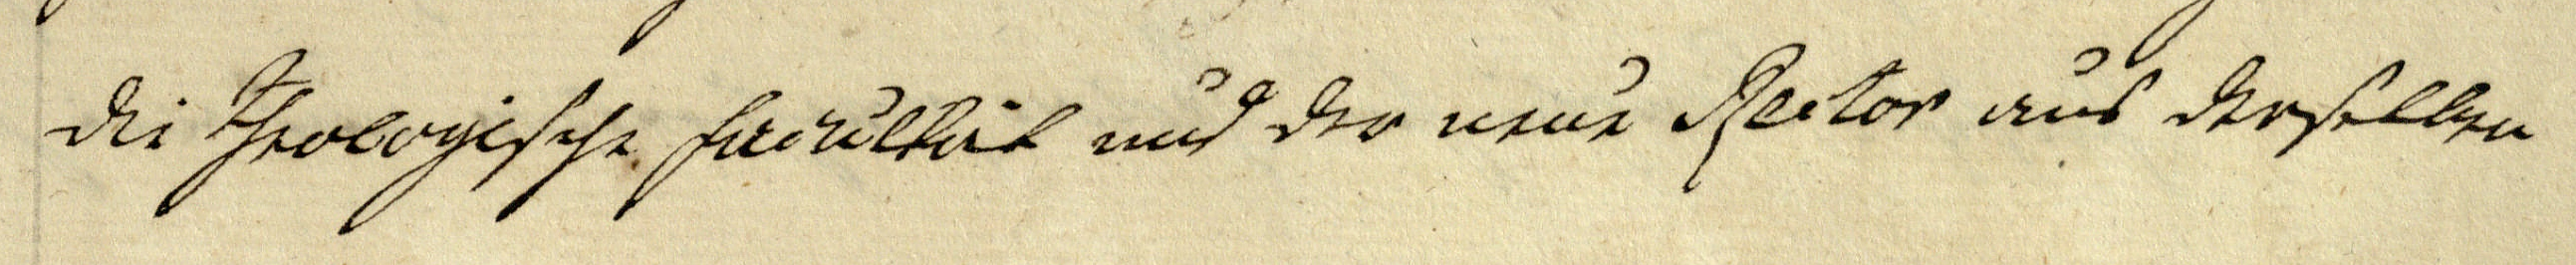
die Theologische Facultät und der neue Rector aus derselben
